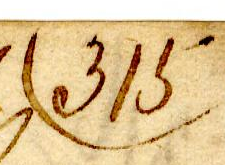315
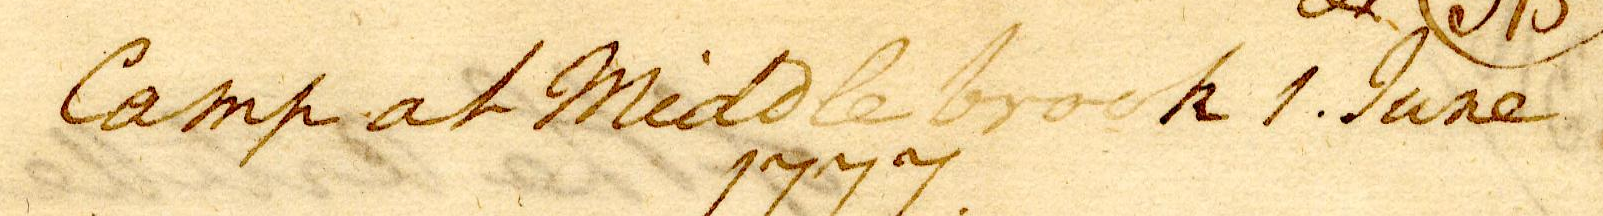Camp at Middlebrook 1^st. June
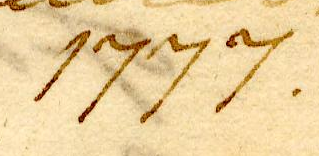1777
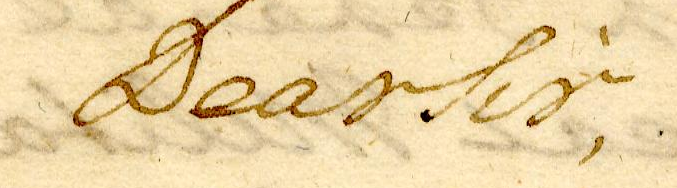Dear Sir,
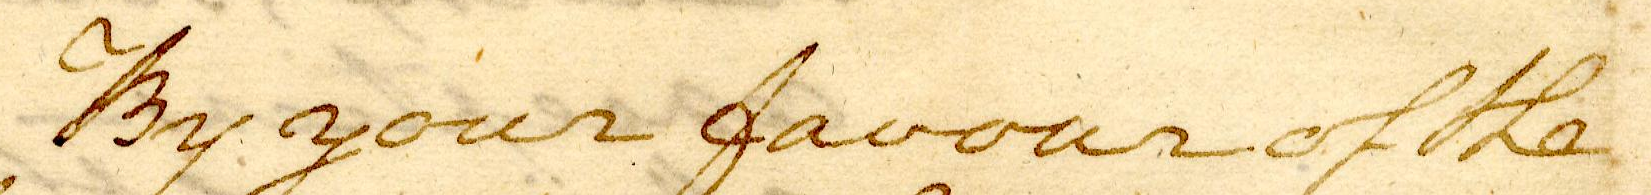By your favour of the
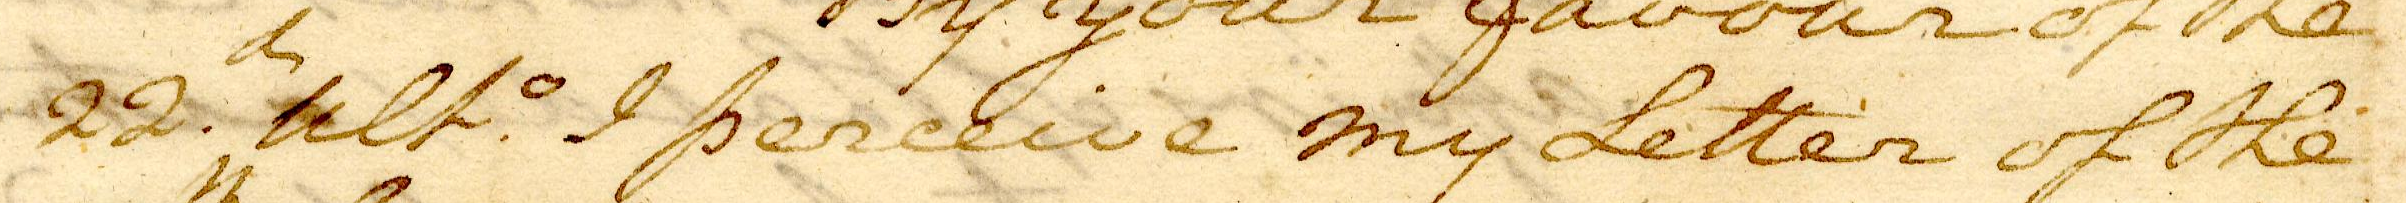22^d ult^o. I perceive my Letter of the
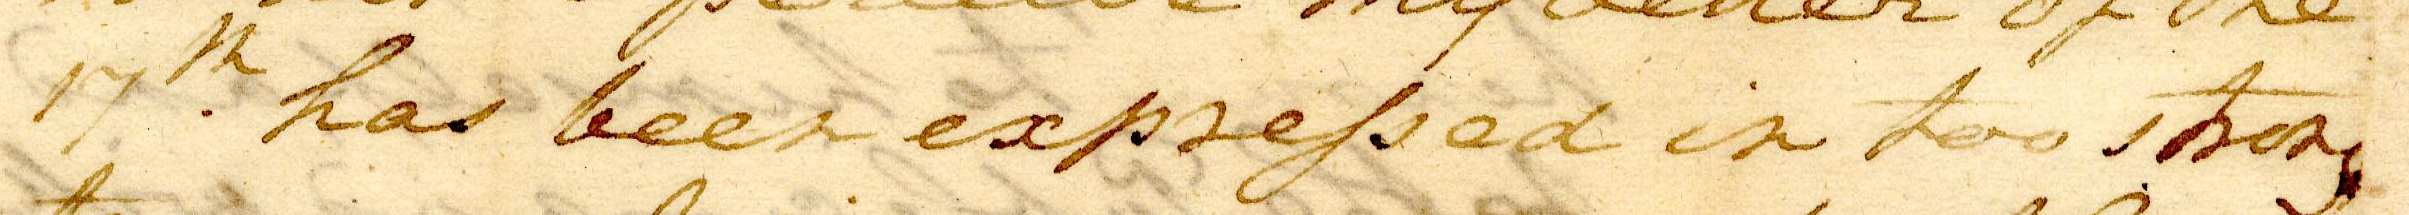17^th. has been expressed in too strong
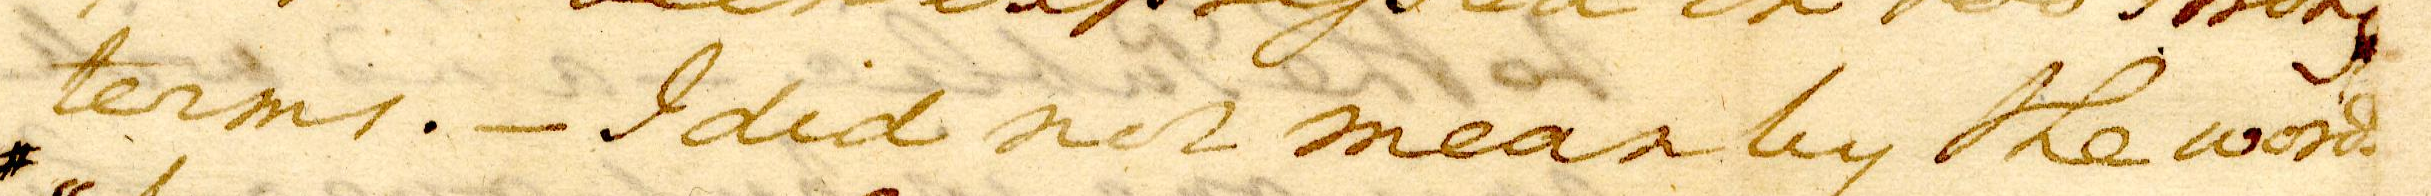terms.- I did not mean by the word
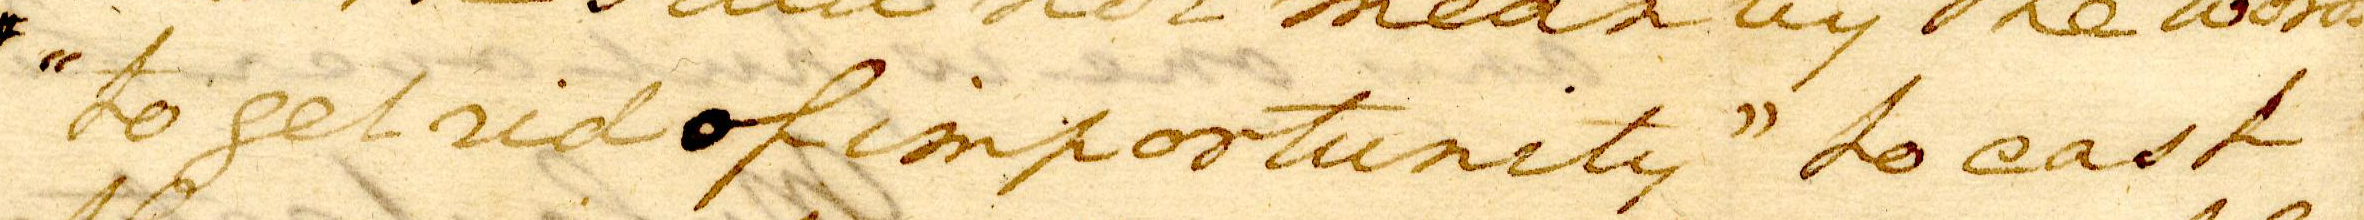"to get rid of importunity" to cast
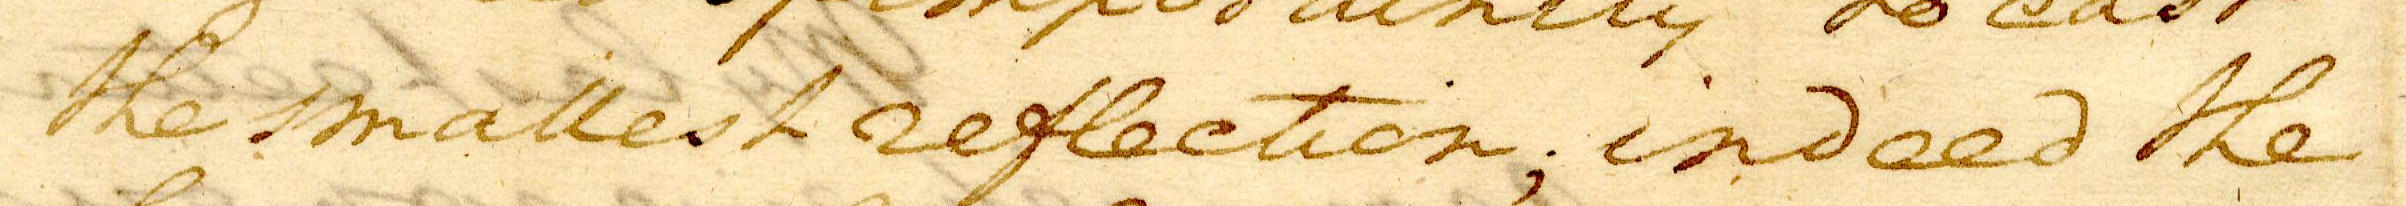the smallest reflection; indeed the
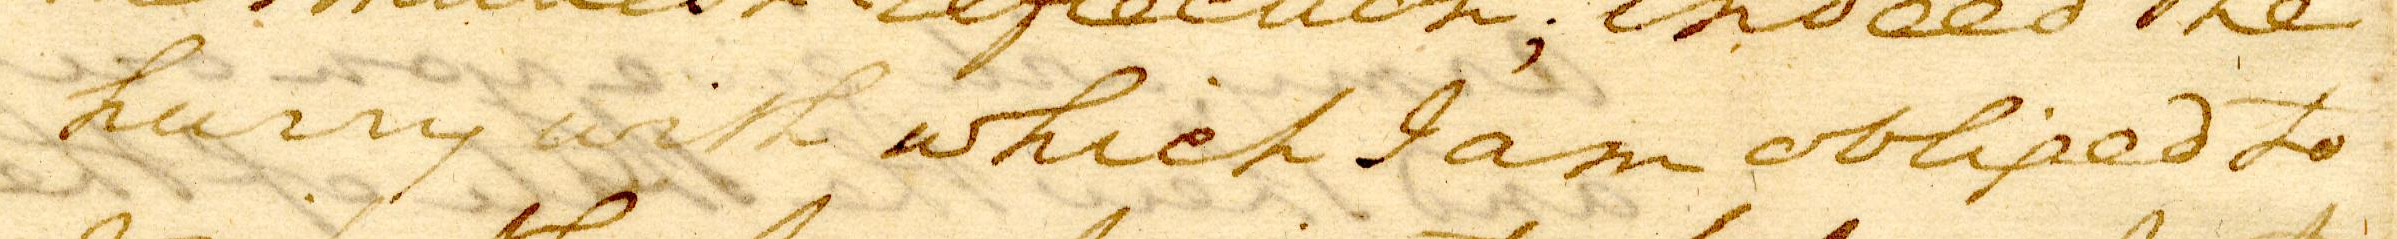hurry with which I am obliged to
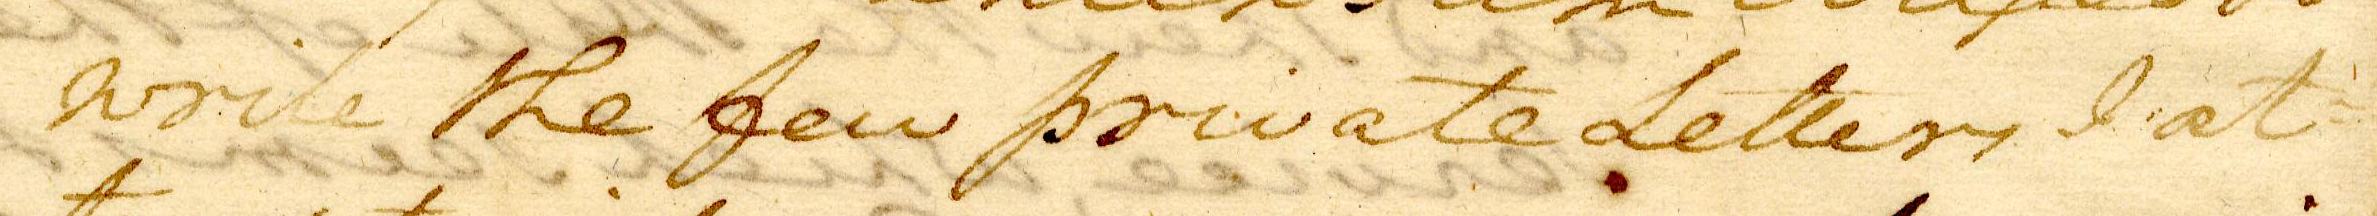write the few private Letters I at-
